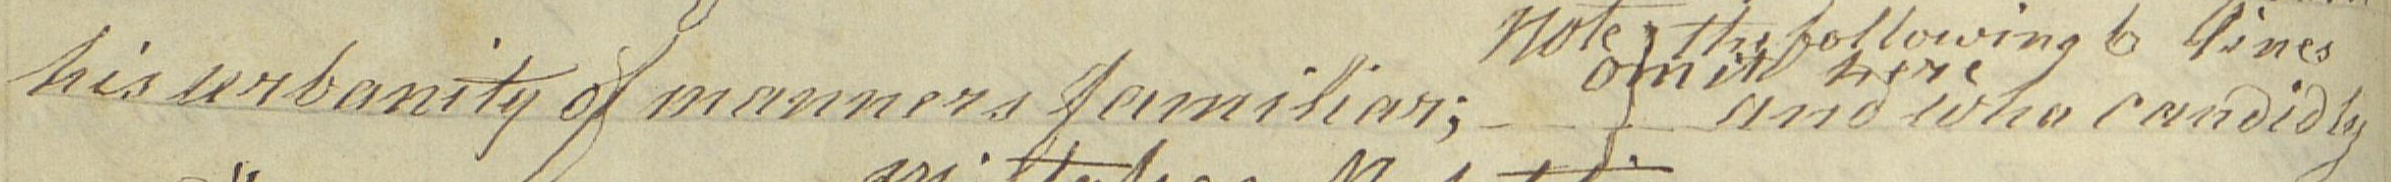his urbanity of manners familiar; and who candidly
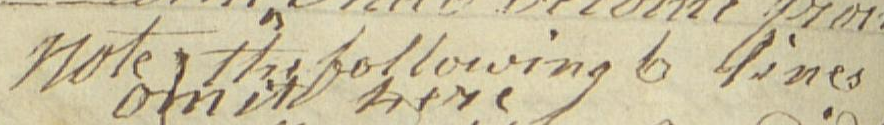Note the following 6 lines
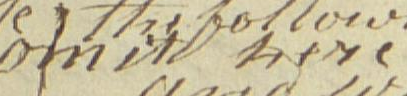Omit here
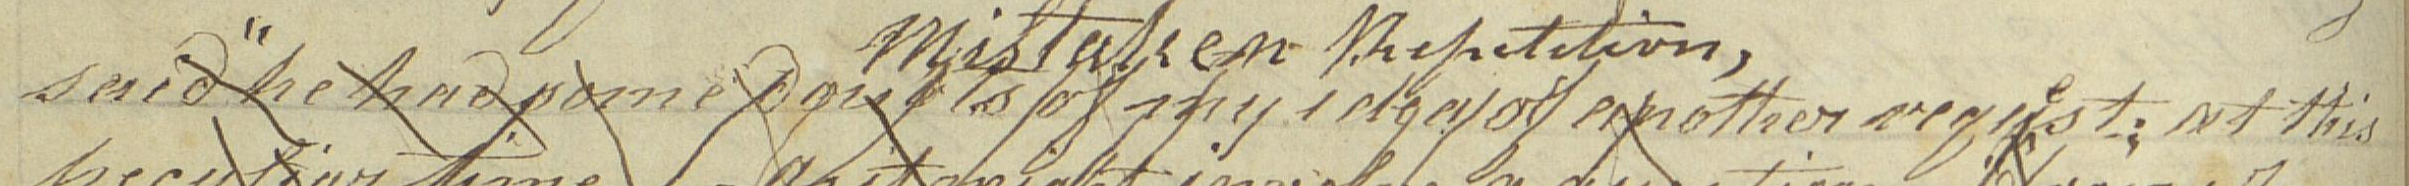said "he had some doubts of my idea of another request: at this
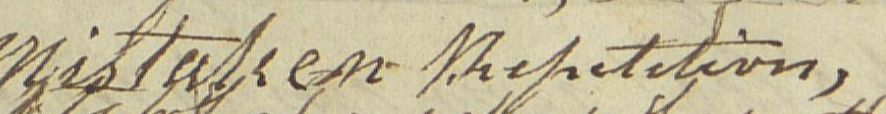Mistaken Reputation,
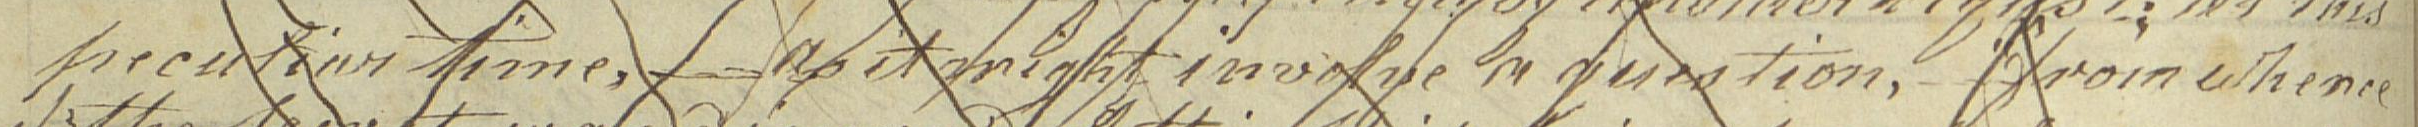peculiar time, as it might involve a question, from whence
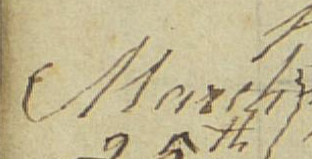March
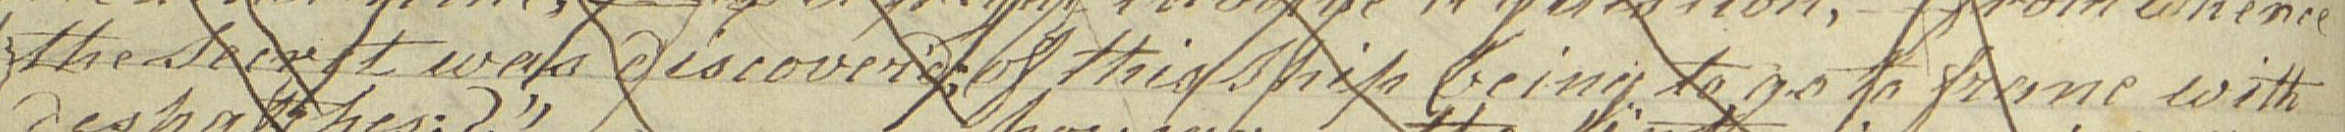the Secret was discover'd; of this ship being to go to frame with
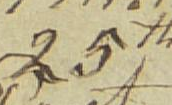25^th
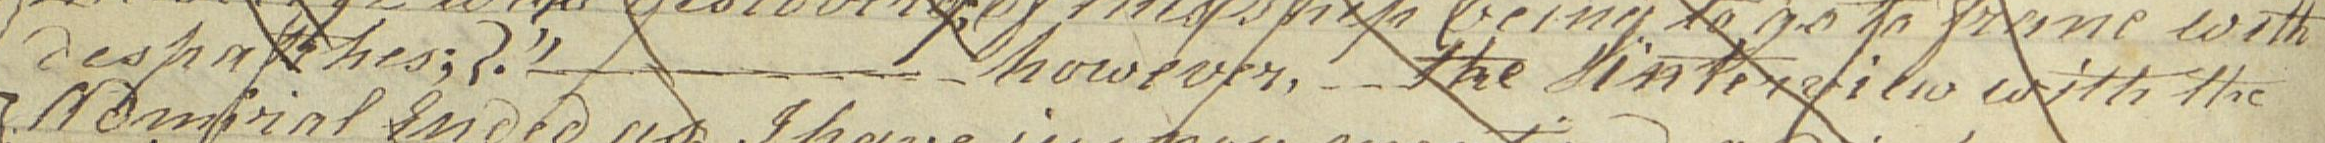despatches;?" however, the interview with the
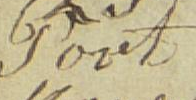Port
